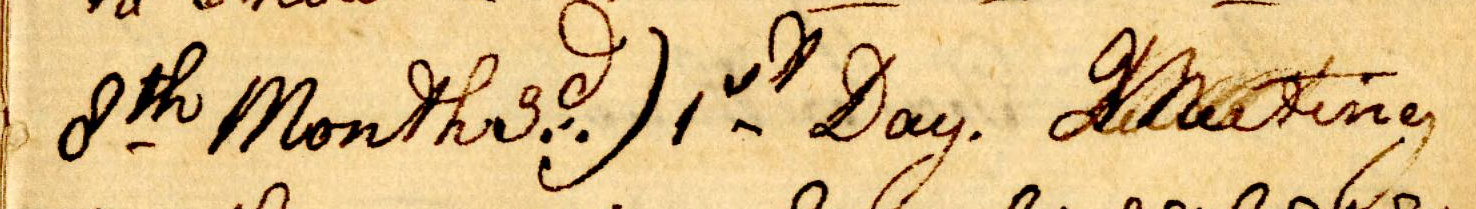8^th Month 3^d ) 1^st Day. Meeting
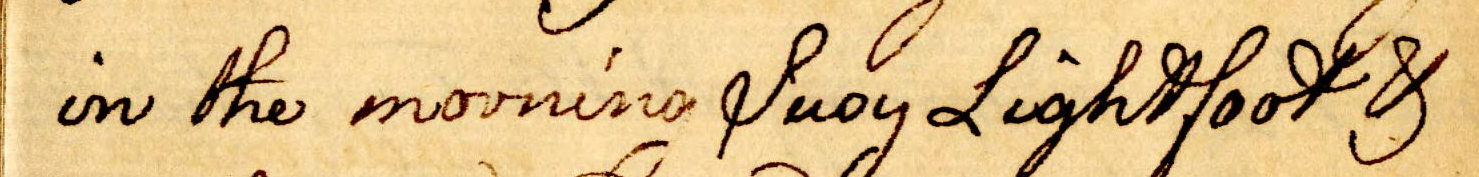in the morning Susy Lightfoot &
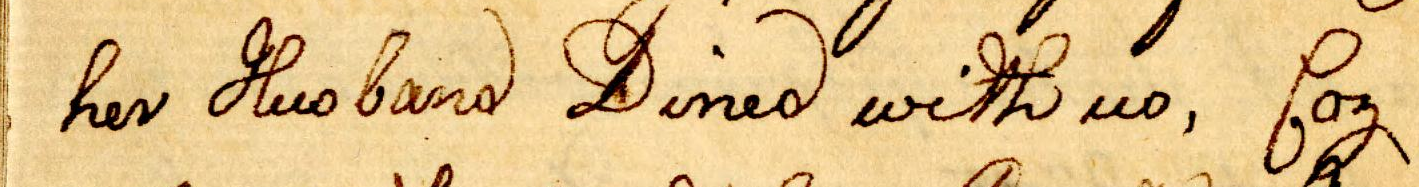her Husband Dined with us, Coz
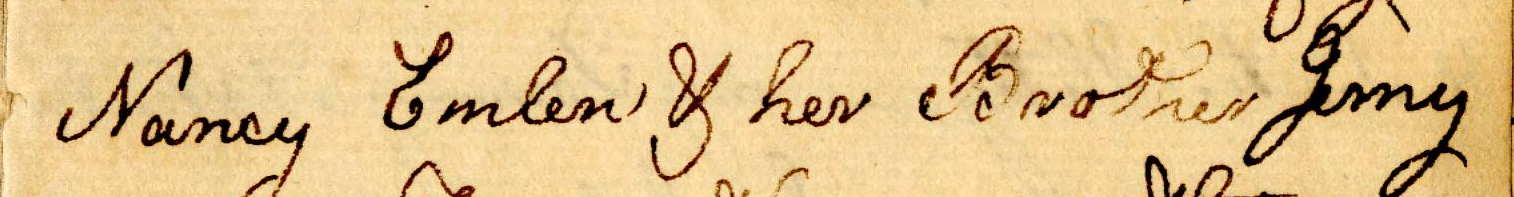Nancy Emlen & her Brother Jemy
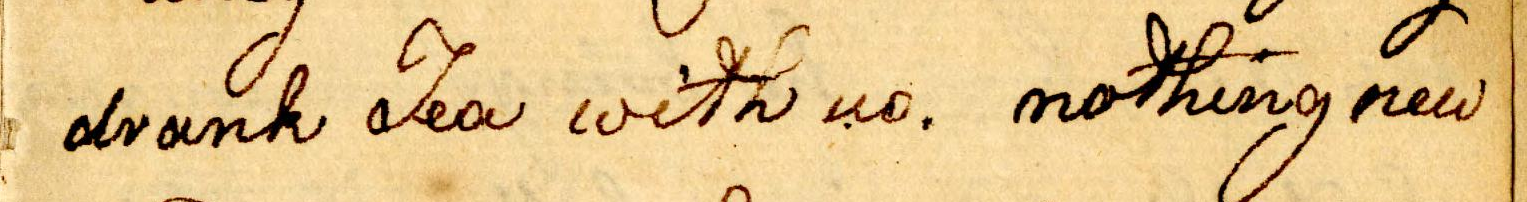drank Tea with us. nothing new
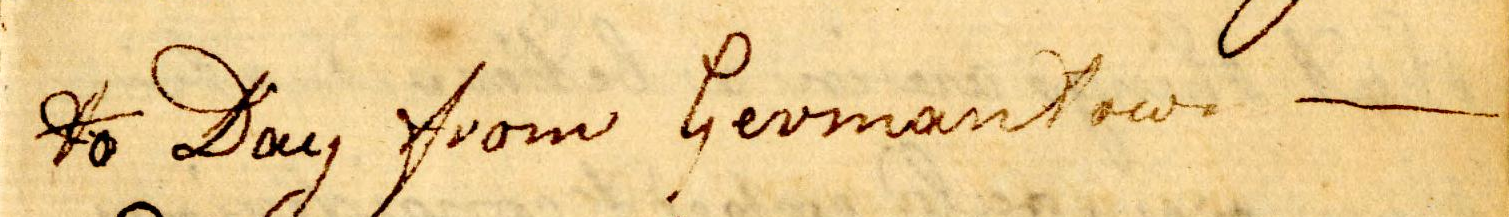to Day from Germantown-
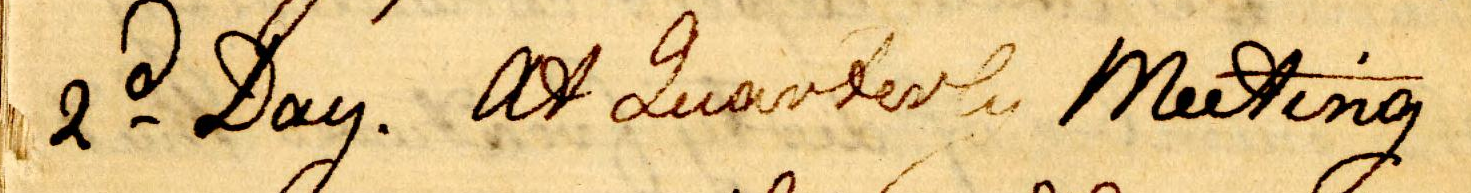2^d Day. At Quarterly Meeting
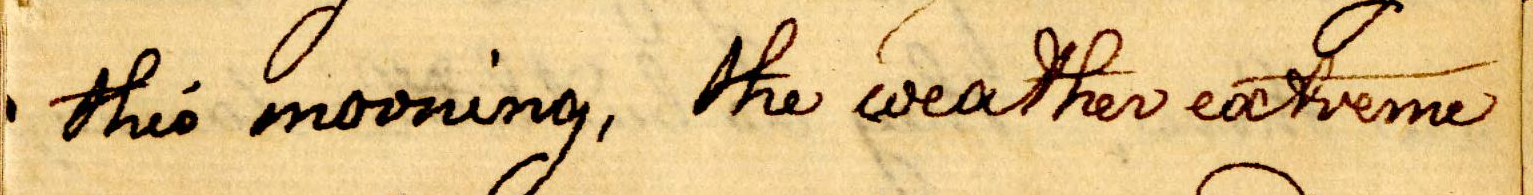this morning, the weather extreme
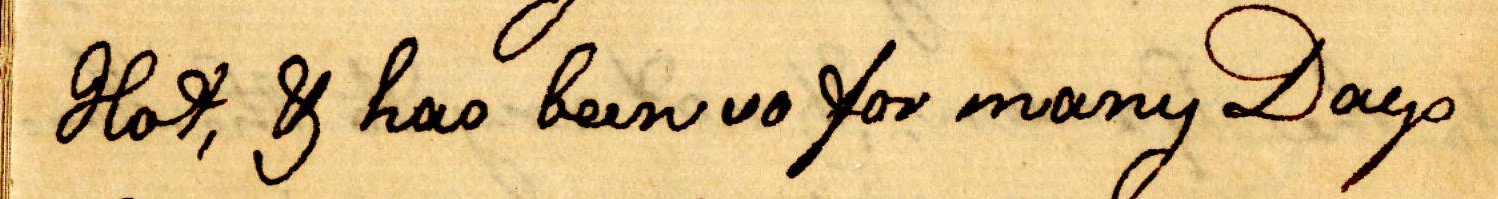Hot, & has been for many Days
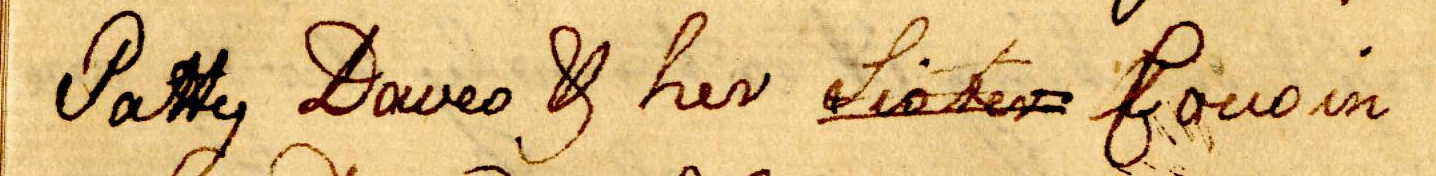Patty Daves & her [Sister] Cousin
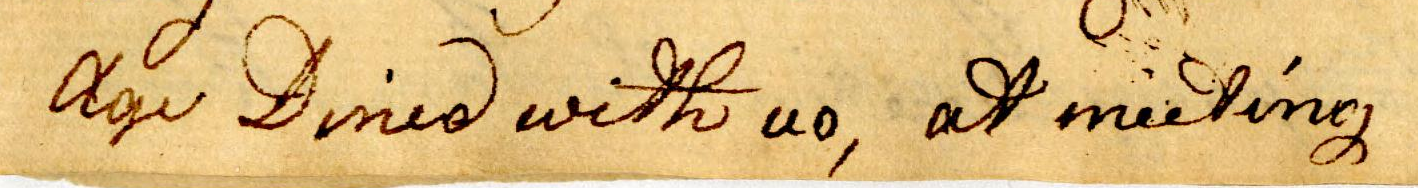Age Dined with us, at meeting
